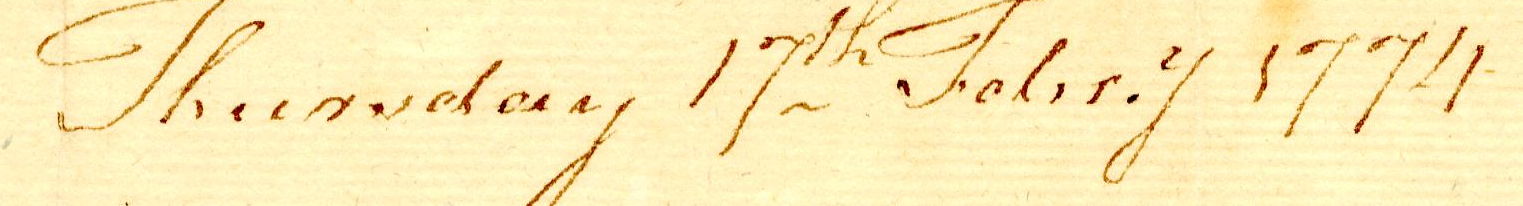Thursday 17^th. Febr^y 1774
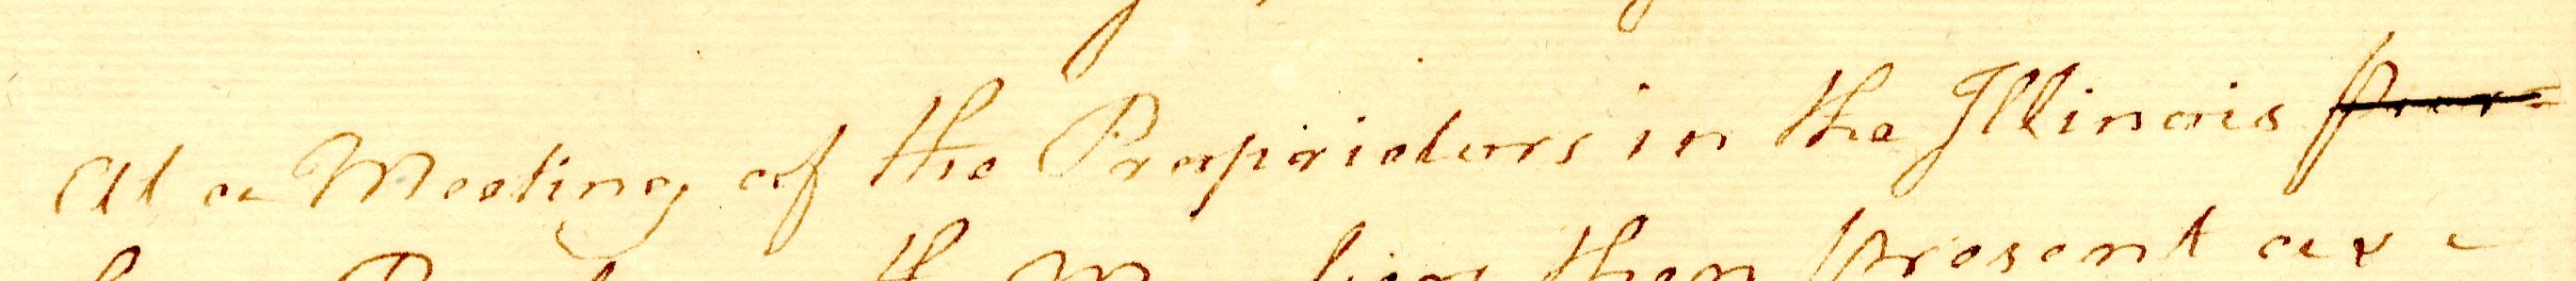At a Meeting of the Proprietors in the Illinois [Purch-]
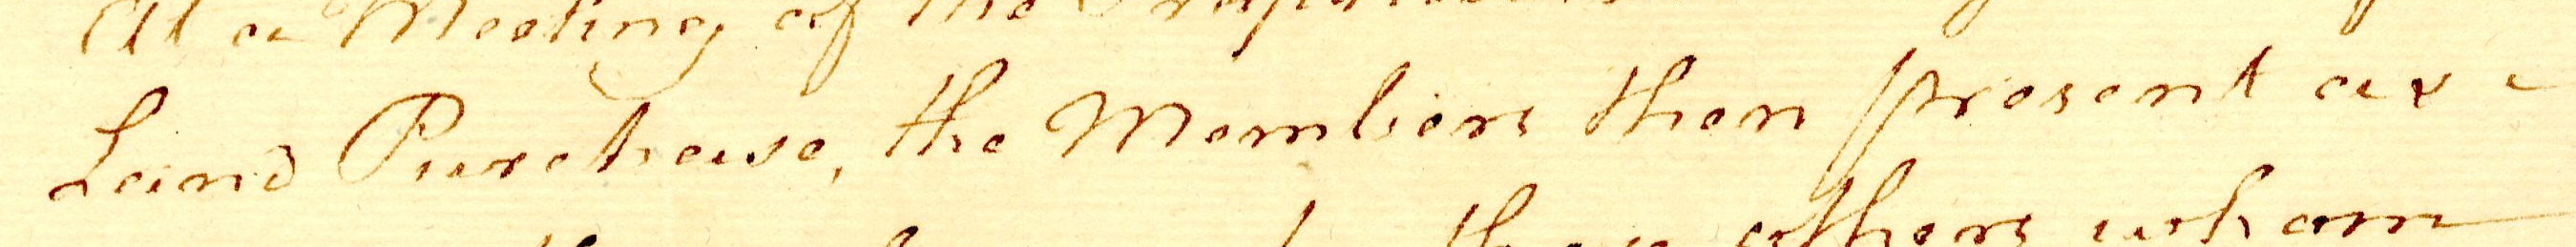Land Purchase, the Members then present as-
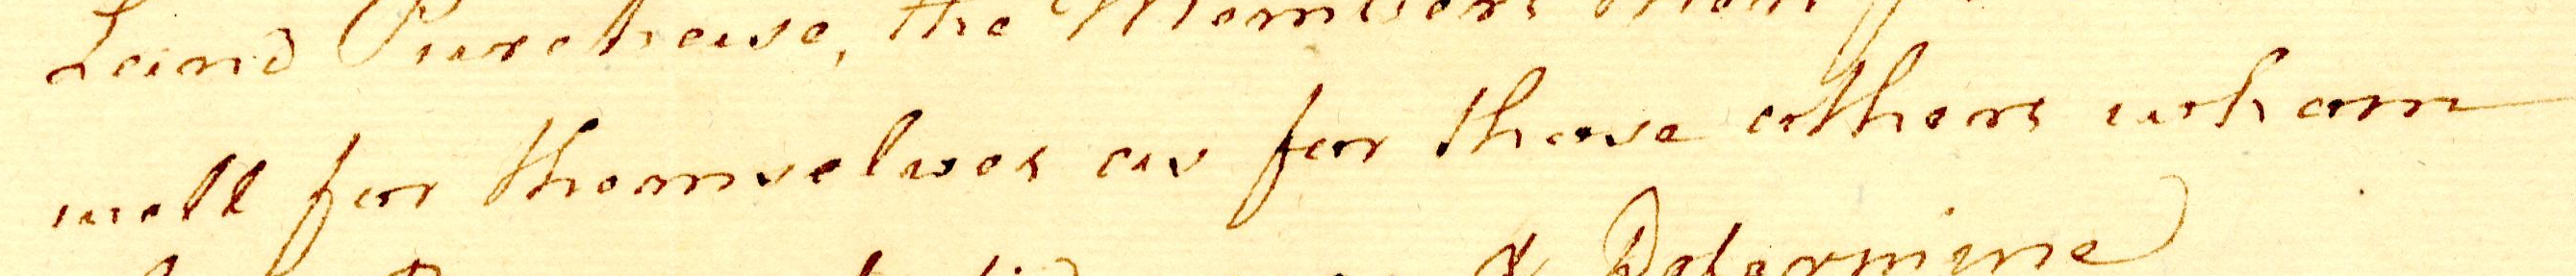-well for themselves as for those others whom
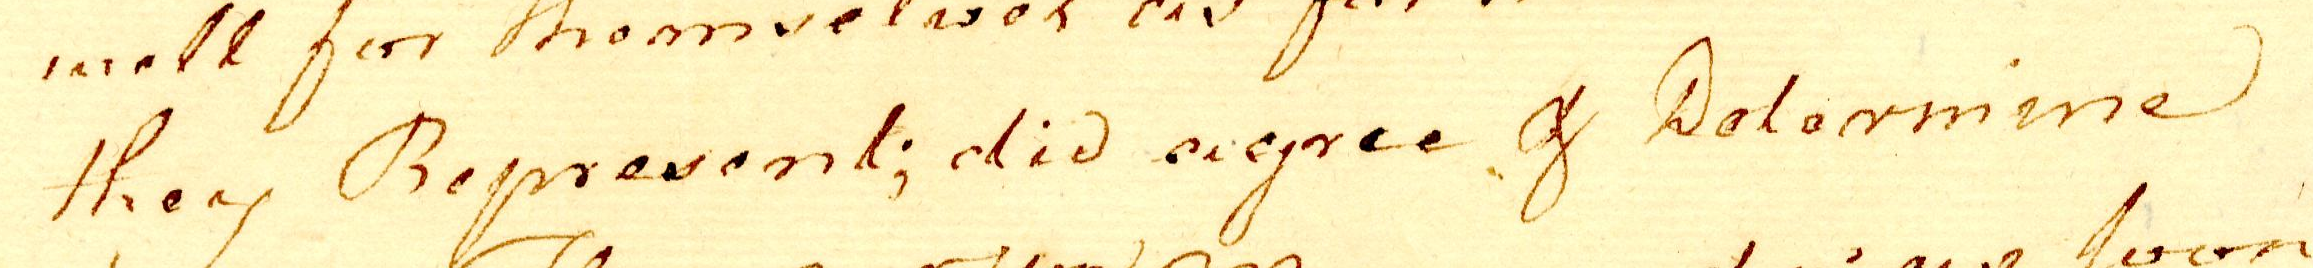they Represent; did agree & Determine
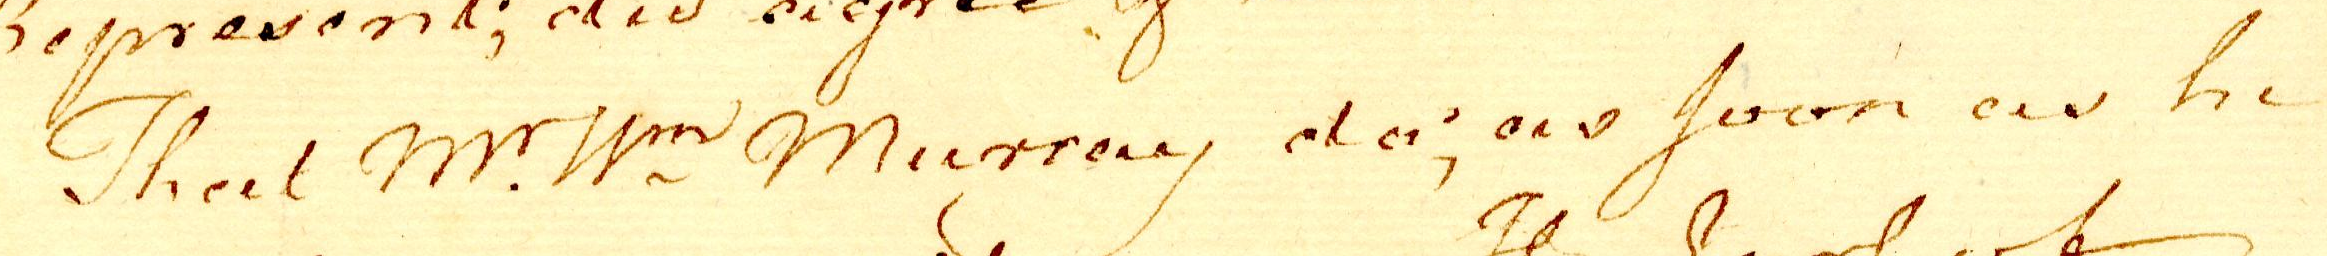That M^r. W^m Murray des^s are soon as he
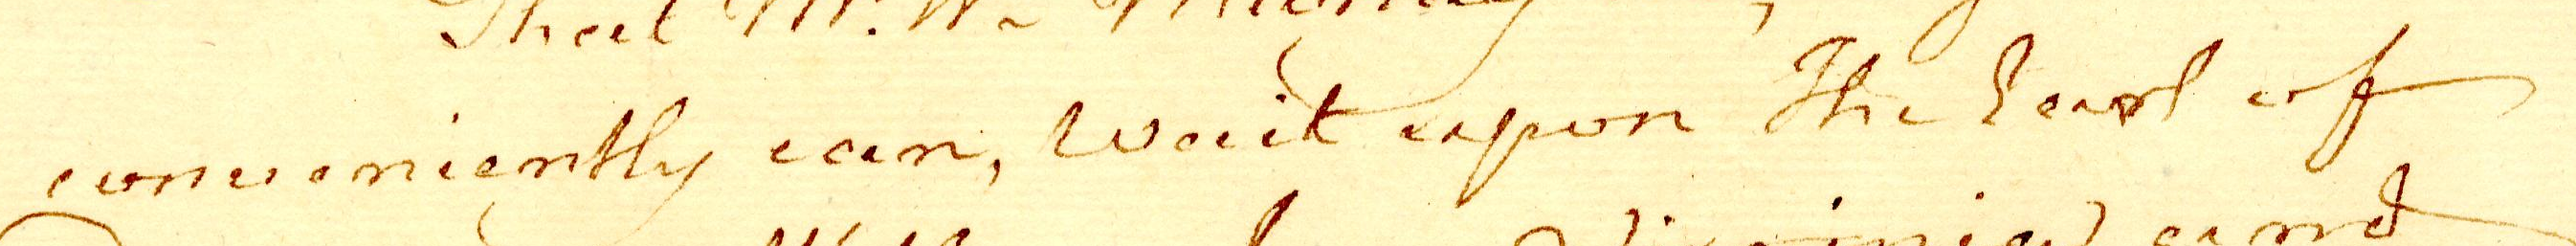convoniently can, wait upon The court of
